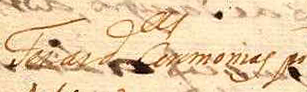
Fes as d.as Ceremonias por
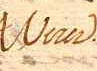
4 Vezes.
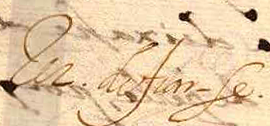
Rez. de fiar-se
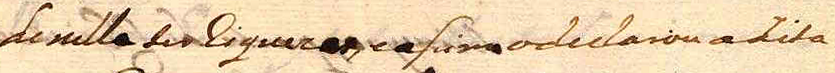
de nella ter Riquezas, e assima o declarou a dita
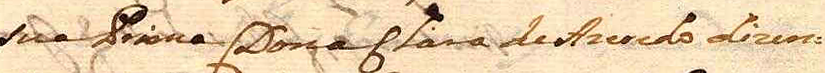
sua Prima Dona Clara de Azeredo dizen
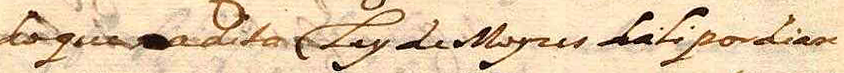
do que na dita Ley de Moyzes dali por dian
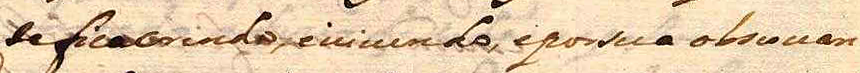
te fica crendo, e uiuendo, e por sua obseruan
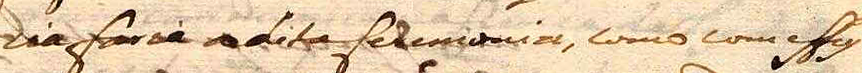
cia faria a dita Ceremonia, como com effey
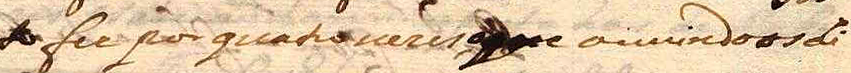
to fez por quatro uezes, e que ouuindo os di
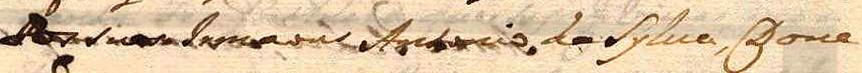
ttos seus Irmaons Antonio da Sylua, Dona
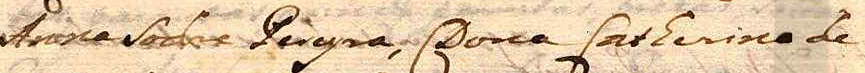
Anna Sodre Pereyra, Dona Catherina de
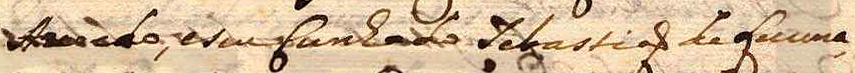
Azeredo, e seu Cunhado Sebastiaõ de Lucena,
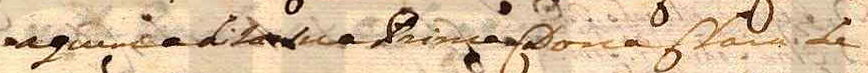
a quem a dita sua Prima Dona Clara de
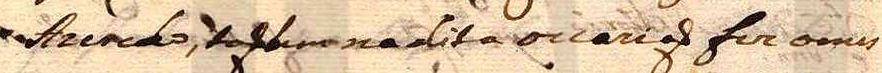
Azeredo, taõ bem na dita occaziaõ fez o mes
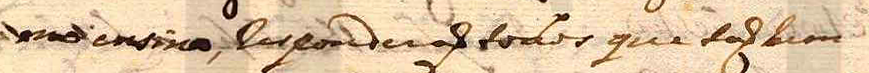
mo ensino, Responderaõ todos que taõbem
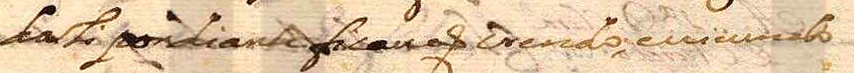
dali por diante ficauaõ crendo; e uiuendo
